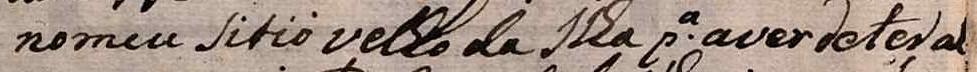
no meu sitio velho da Ilha p.a aver de ter al
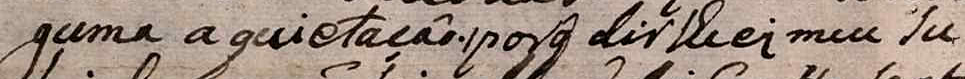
guma aquietaçaõ./ porq̄ dirlheei meu su
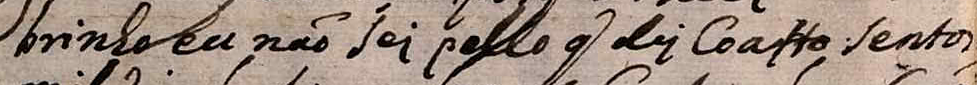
brinho eu naõ sei pello q̄ dej Coattosentos
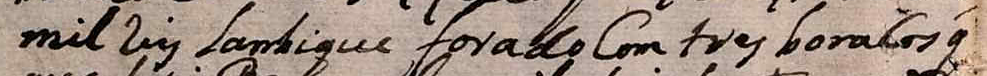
mil Reis Lanbique forado Com tres boraCos q̄
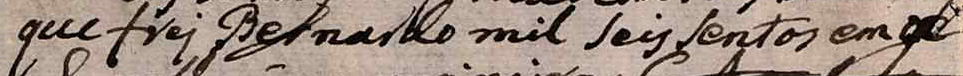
que fres Bernardo mil seissentos emge
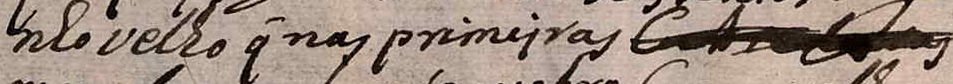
nho velho q̄ nas primejras ___
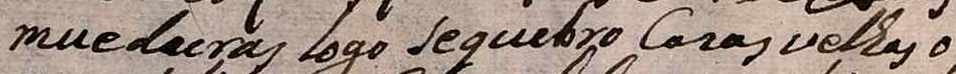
mueduras logo se quebro Cazas velhas o
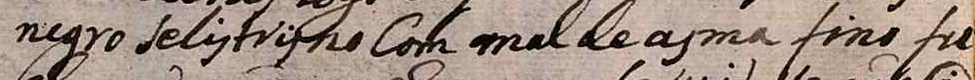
negro selistryno Com mal de asma fino fu
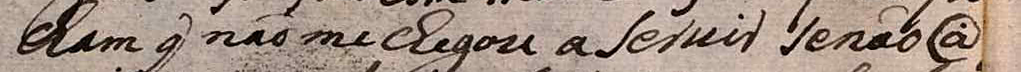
cham q̄ naõ me chegou a seruir senaõ ā
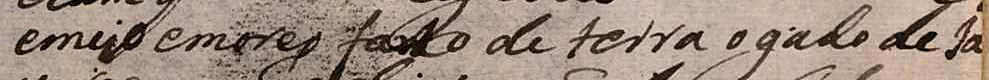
e meio e moreo tanto de terra o gado de Ia
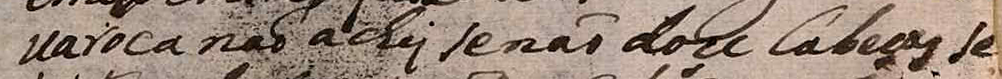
uaroca naõ achej se naõ doze Cabeças se
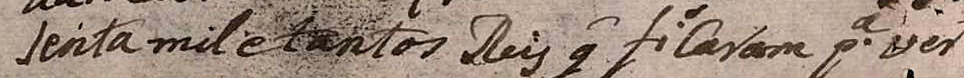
senta mil e tantos Reis q̄ fiCaram p.a ver
